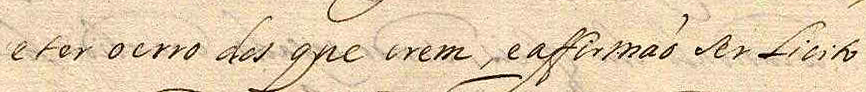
e ter o erro dos que crem, e affirmaõ ser Licito
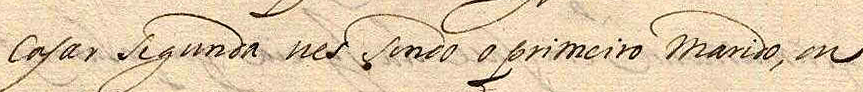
casar segunda ues sendo o primeiro marido, ou
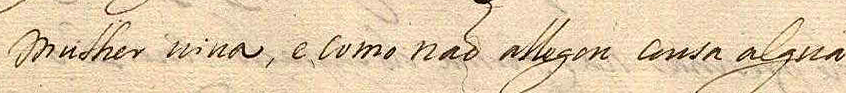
mulher uiua, e como não allegou cousa alguā
